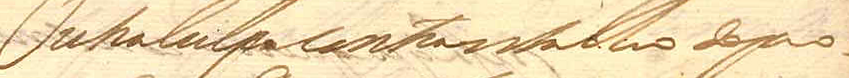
Outra Culpa contra este Reo do pro
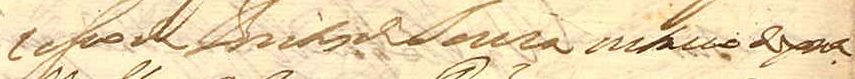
cesso de Brites de Souza outauo de xn.a
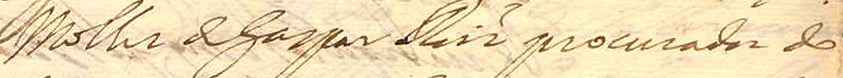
Molher de Gaspar Roiz̄ procurador do
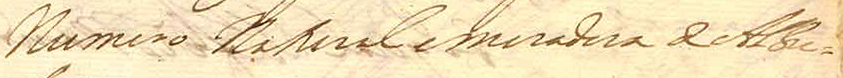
Numero Natural e moradora de Albu
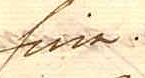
feira.
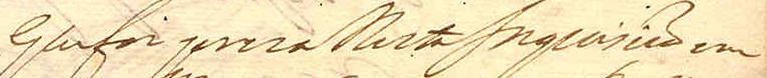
Que foi preza Nesta Jnquisiçaõ em
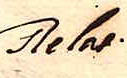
Relat.
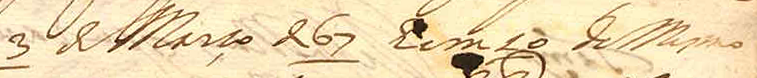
3 de Março de 67 E em 10 do Mesmo
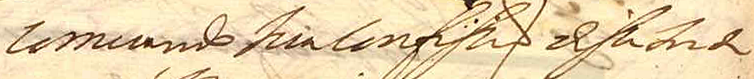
começando sua confissaõ disse ser de
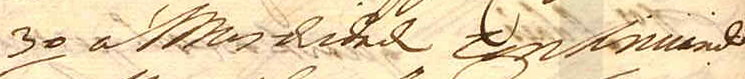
30 aNNos de idade continuando
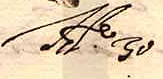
Id.e 30
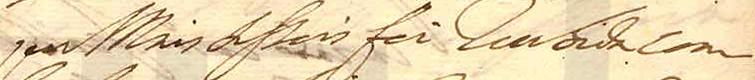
por Mais sessois foi recebida com
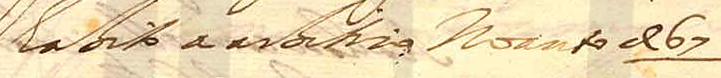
habito a arbitrio No auto de 67
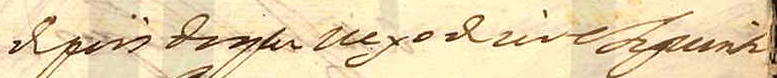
depois do que ueyo dizer o Seguinte
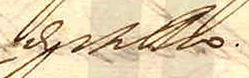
deste Reo.
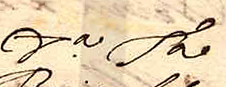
8.a Ta
